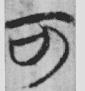可
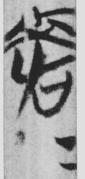差
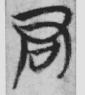君
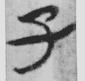子
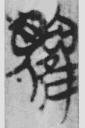觀
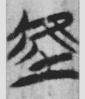𫊟（吾）
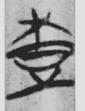梪（樹）
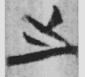之
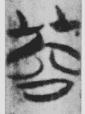蓉（容）
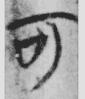可
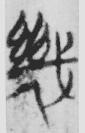幾（豈）
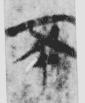不
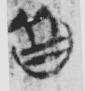皆
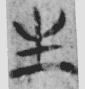生
